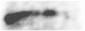一
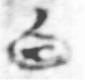囟
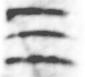三
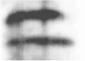二
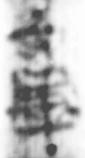𨍱（乘）
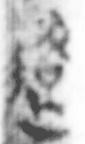○（路）
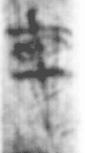車
